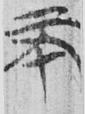不
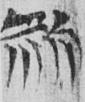祈
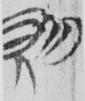則
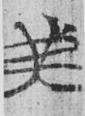弗
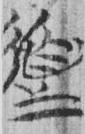道
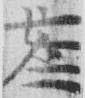武
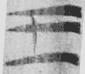王
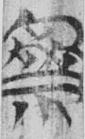齋
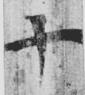七
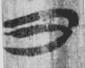日
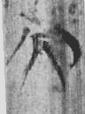大（太）
